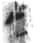凡
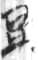○（樹）
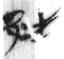邦
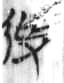{尸拃}（作）
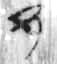邑
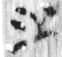之
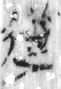道
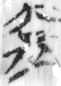盍（蓋）
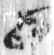西
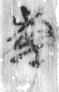南
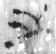之
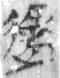遇（寓）
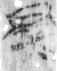君
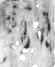凥（居）
